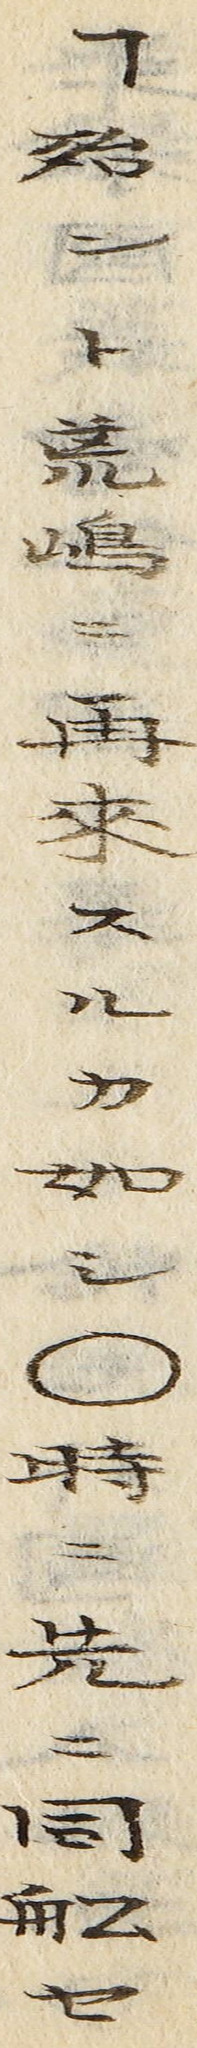コト殆ント荒嶋ニ再来スルカ如シ◯時ニ先ニ同船セ
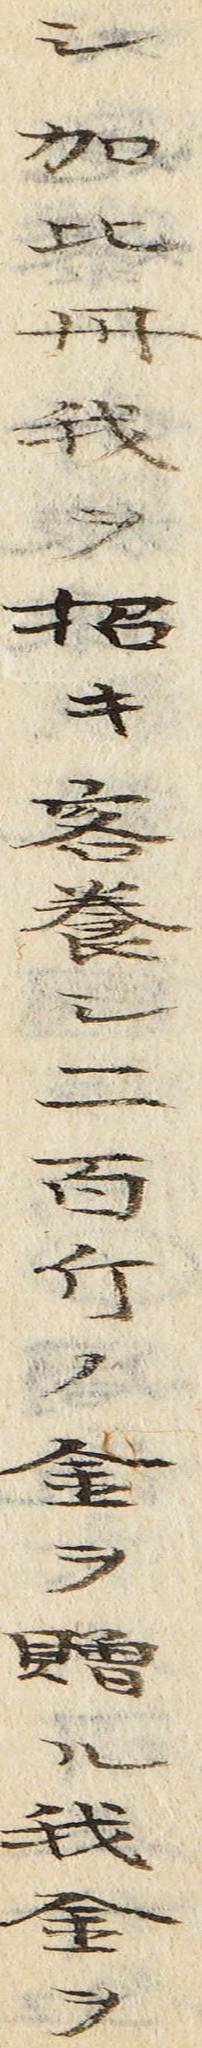シ加比丹我ヲ招キ客養シ二百斤ノ金ヲ贈ル我金ヲ
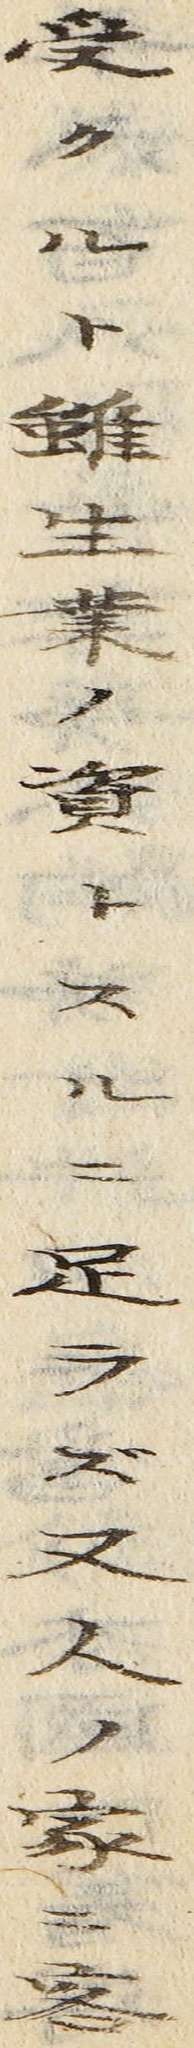受クルト雖生業ノ資トスルニ足ラズ又人ノ家ニ客
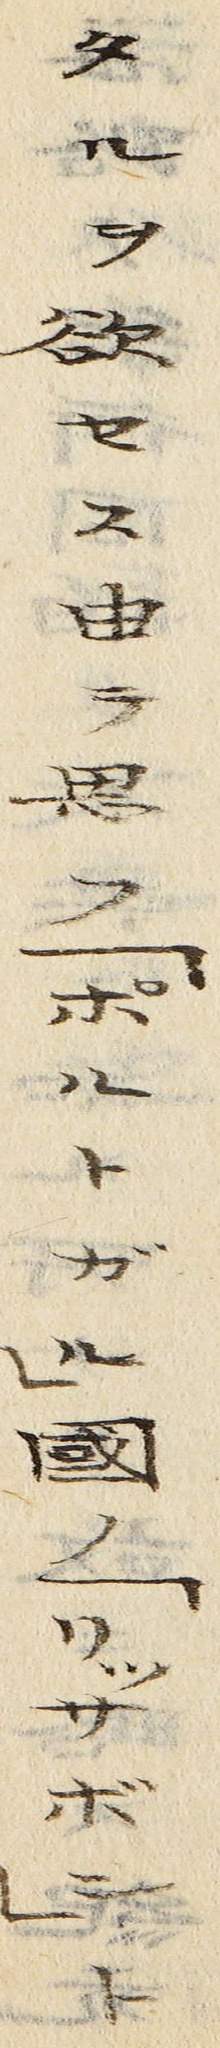タルヲ欲セス由テ思フ「ポルトガル」国ノ「リッサボン」ト
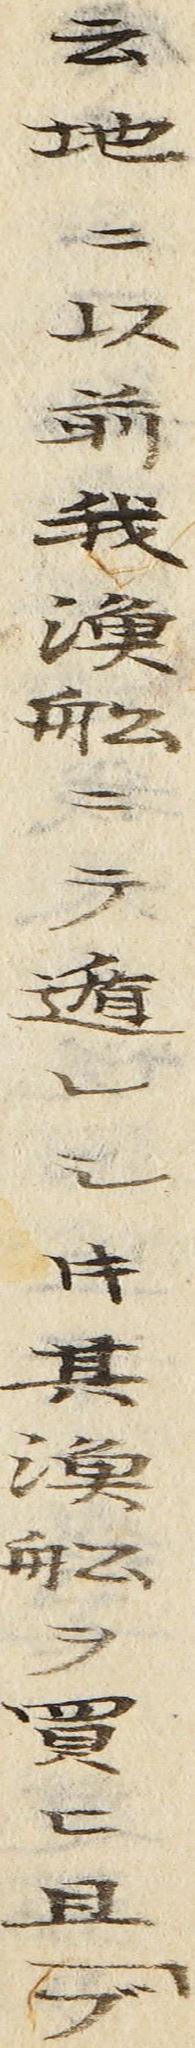云地ニ以前我漁船ニテ遁レシトキ其漁船ヲ買ヒ且「ブ
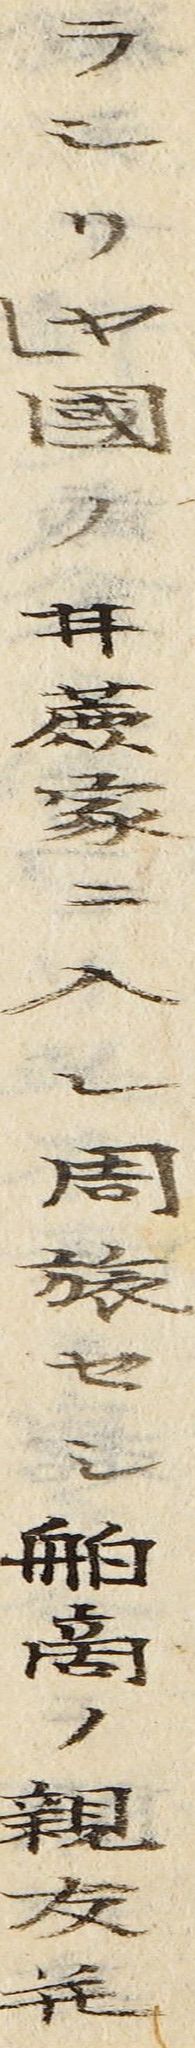ラシリヤ」国ノ甘蔗家ニ入レ周旅セシ舶商ノ親友并
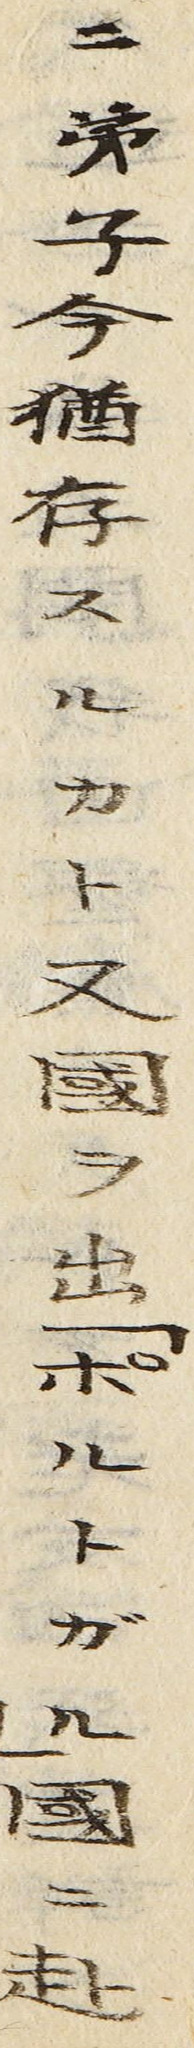ニ弟子今猶存スルカト又国ヲ出「ポルトガル」国ニ赴
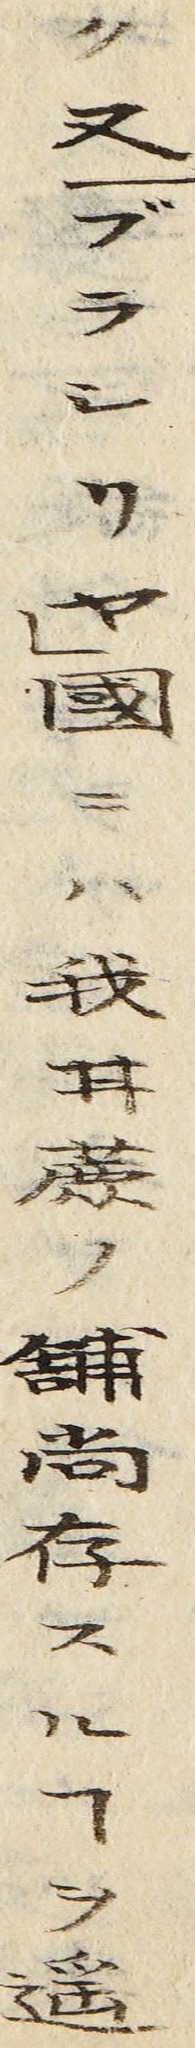ク又「ブラシリヤ」国ニハ我甘蔗ノ舗尚存スルコトヲ遥
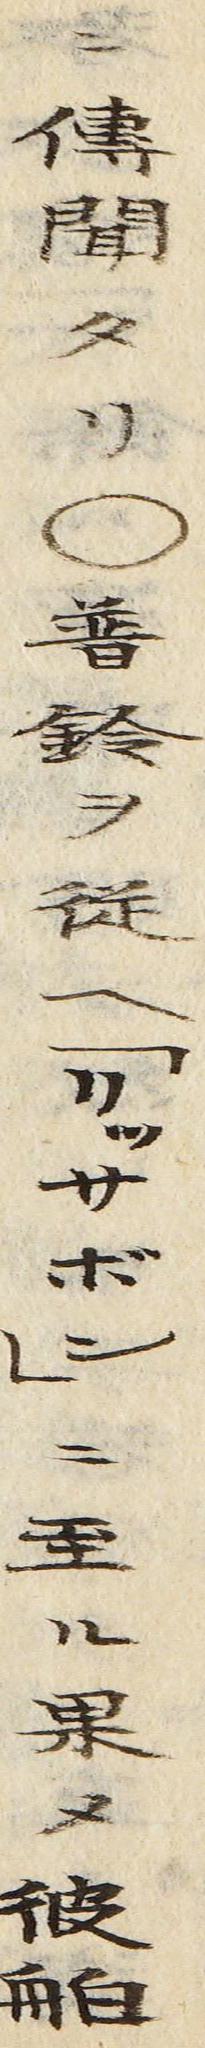ニ伝聞タリ◯普鈴ヲ従ヘ「リッサボン」ニ至ル果シテ彼舶
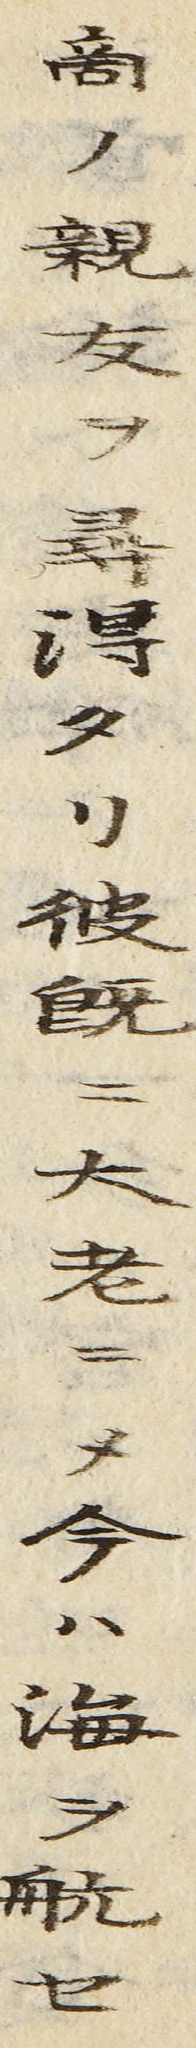商ノ親友ヲ尋得タリ彼既ニ大老ニシテ今ハ海ヲ航セ
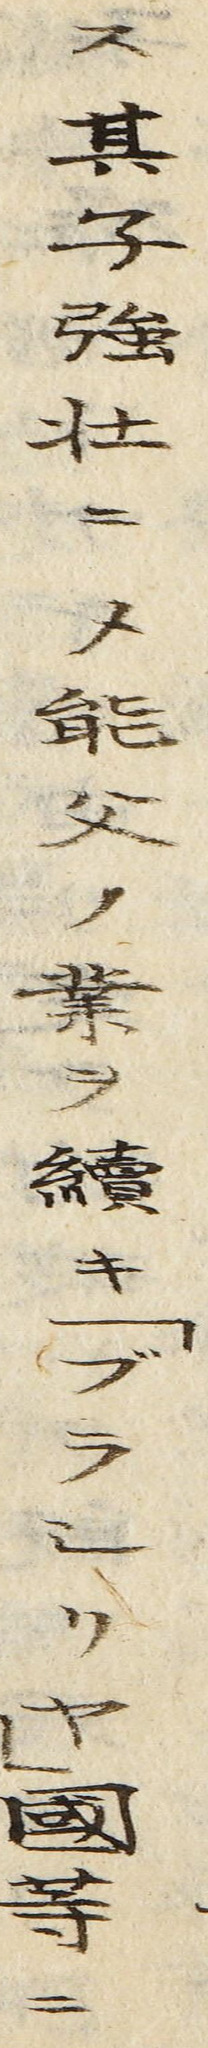ス其子強壮ニシテ能父ノ業ヲ続キ「ブラシリヤ」国等ニ
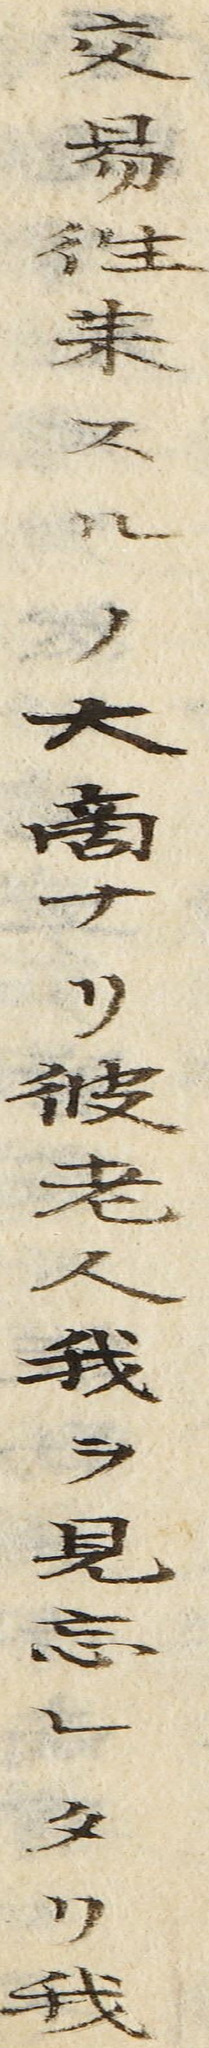交易往来スルノ大商ナリ彼老人我ヲ見忘レタリ我
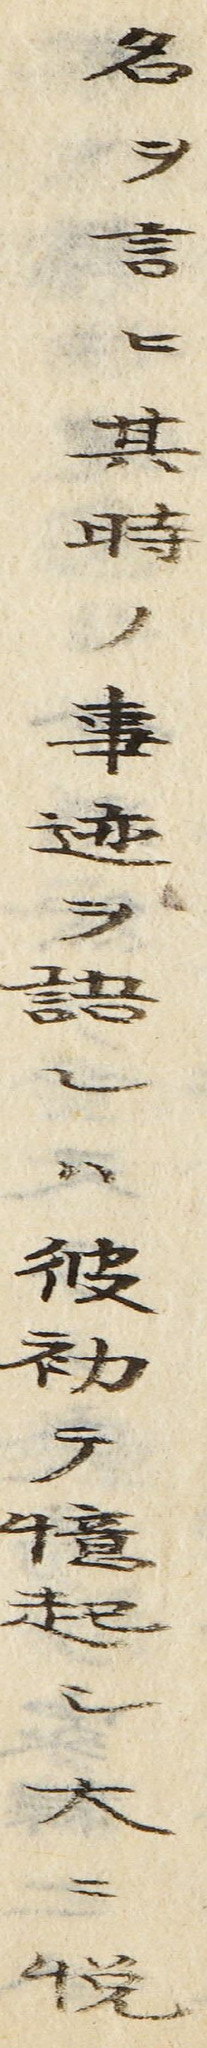名ヲ言ヒ其時ノ事迹ヲ語レハ彼初テ憶起シ大ニ悦
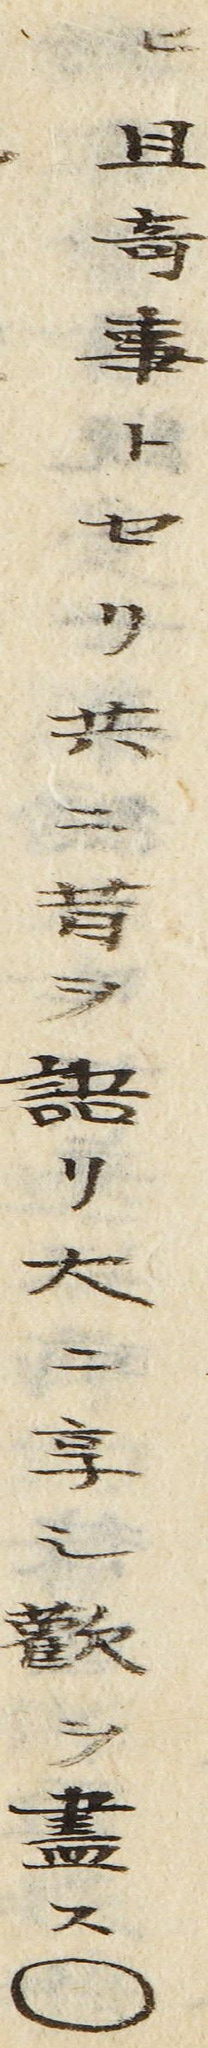ヒ且奇事トセリ共ニ昔ヲ語リ大ニ享シ歓ヲ尽ス◯
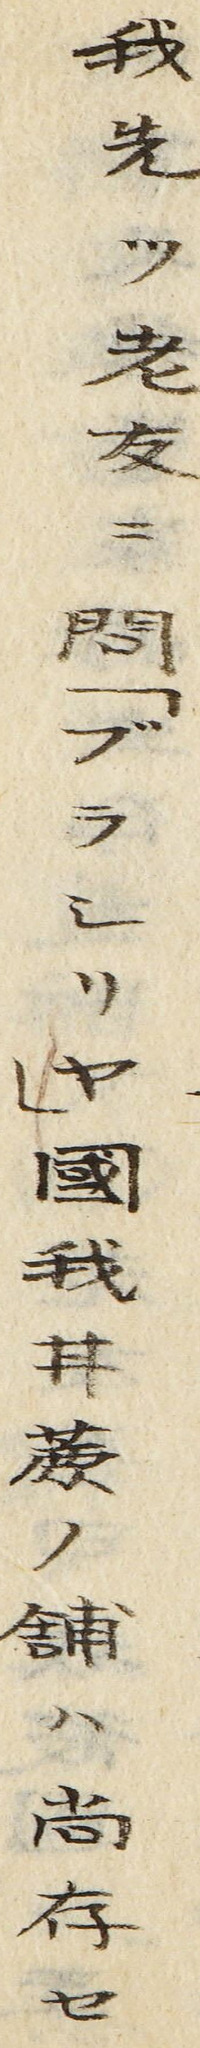我先ツ老友ニ問「ブラシリヤ」国我甘蔗ノ舗ハ尚存セ

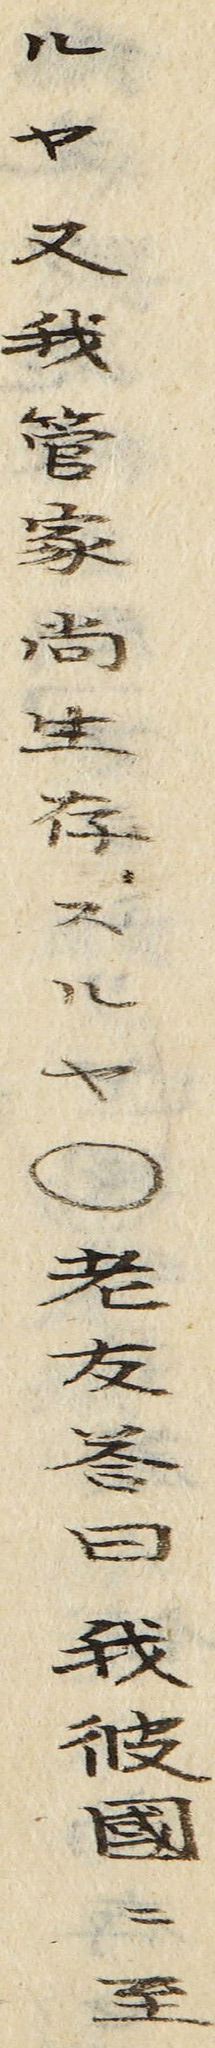ルヤ又我管家尚生存スルヤ◯老友答曰我彼国ニ至
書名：漂流紀事
